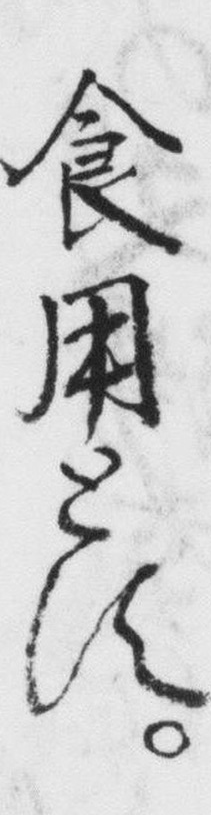食用とす。
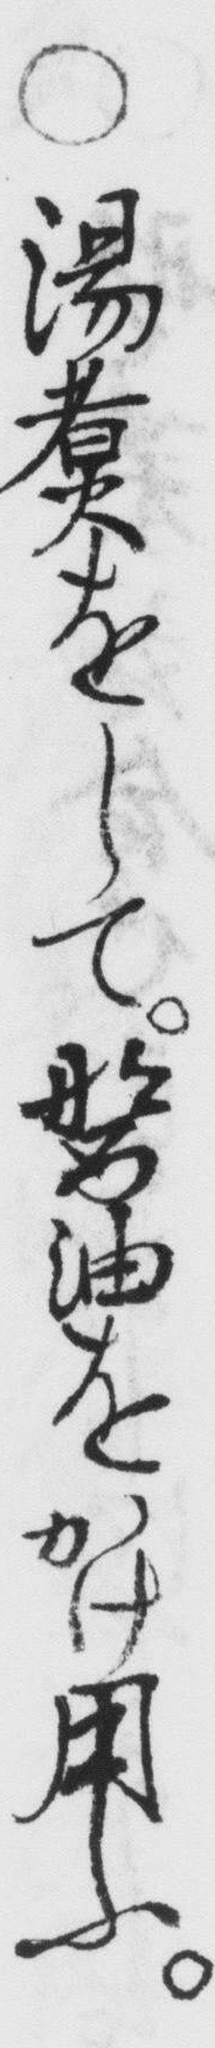○湯煮をして。醤油をかけ用ふ。
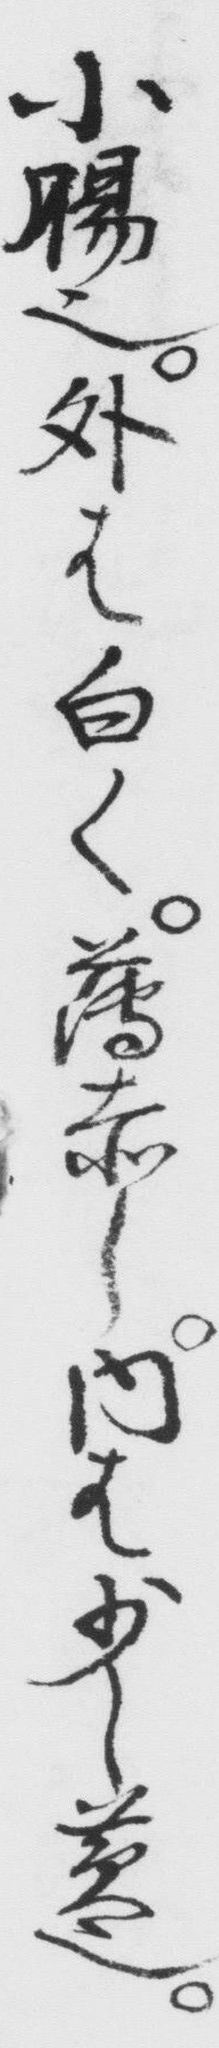百尋小腸也。外は白く。薄赤し。内は少し黄也。

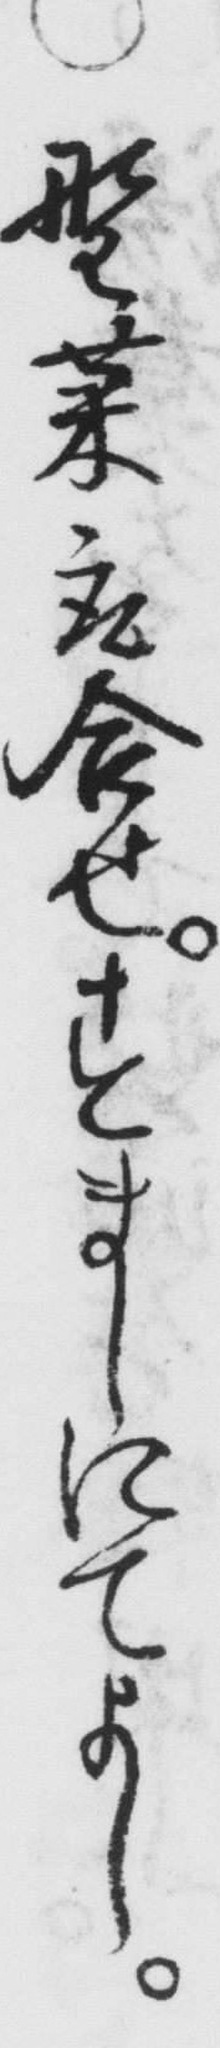○野菜取合せ。すましにてよし。
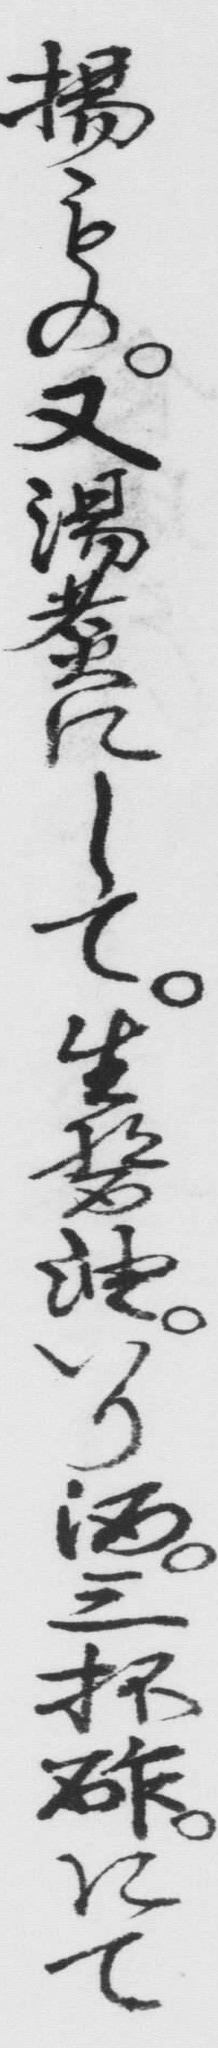揚もの。又湯煮にして。生醤油。いり酒。三杯酢にて
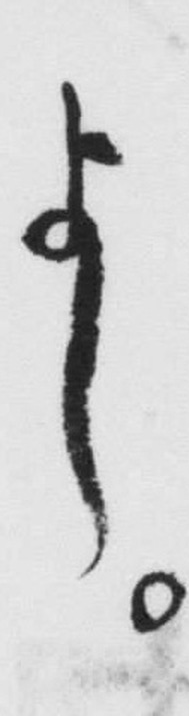よし。
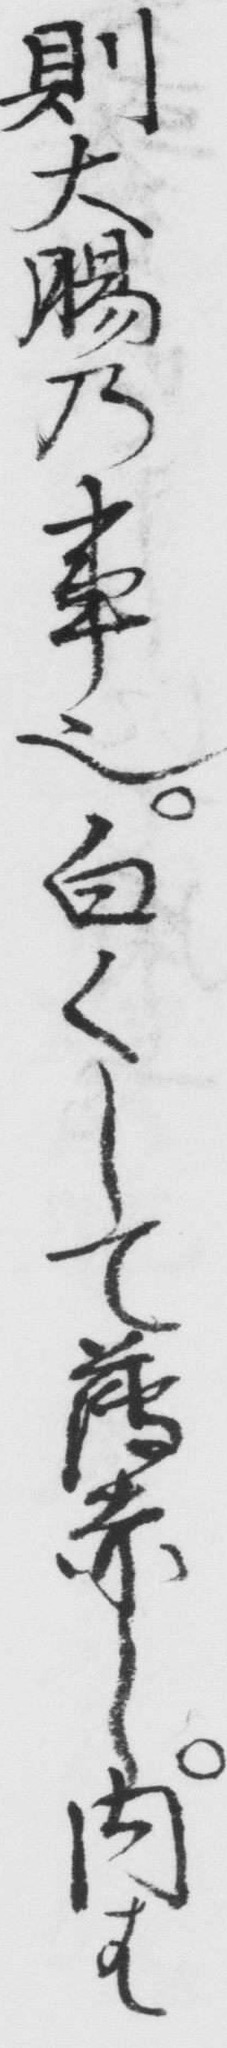大腸則大腸の事也。白くして薄赤し。内は
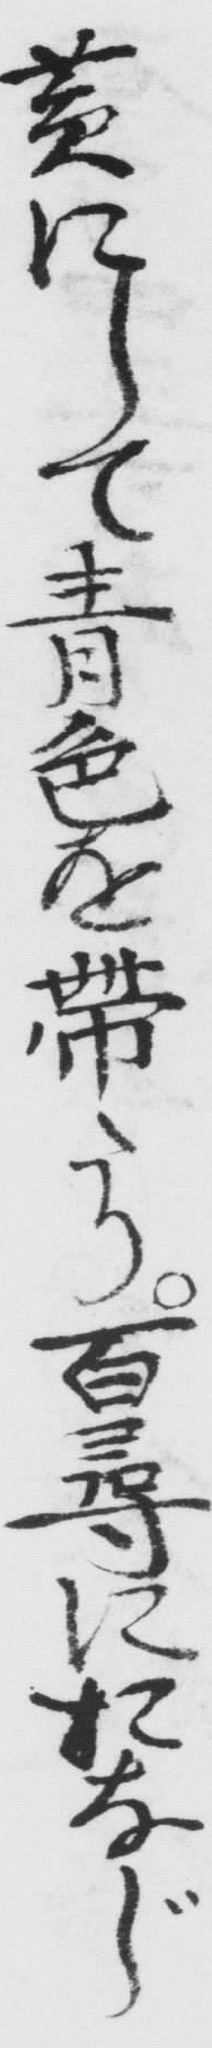黄にして青色を帯たり。百尋におなじ
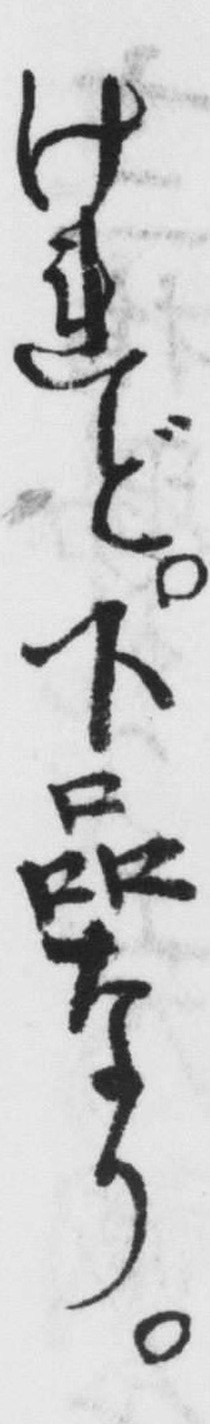けれど。下品なり。
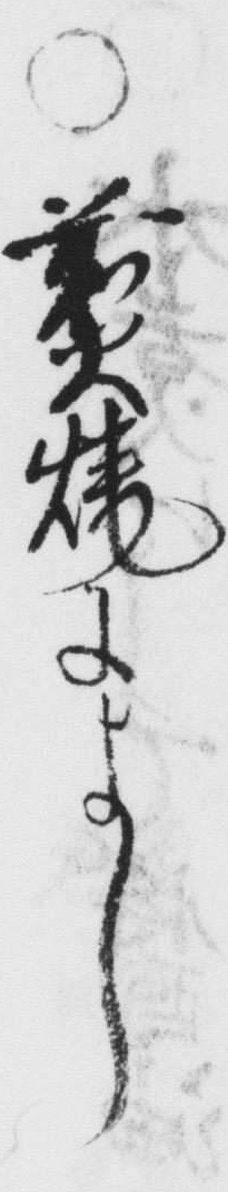○煎焼によし
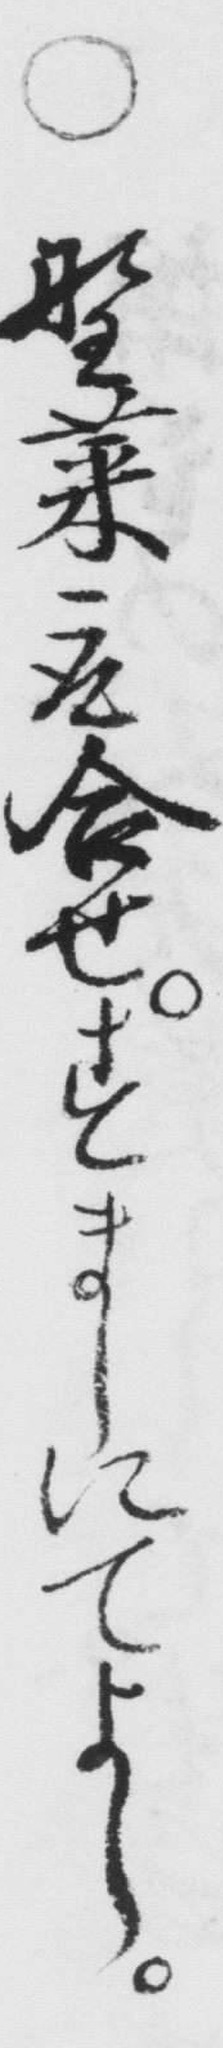○野菜取合せ。すましにてよし。
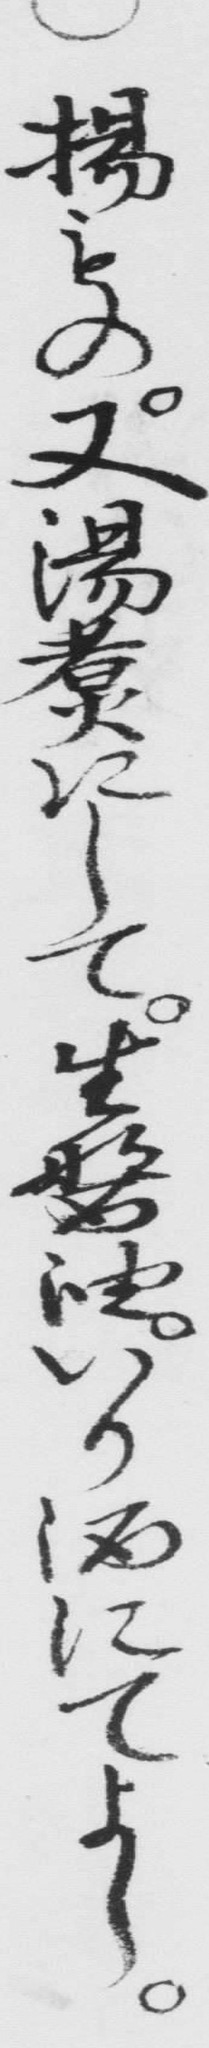○揚もの。又湯煮にして。生醤油。いり酒にてよし。
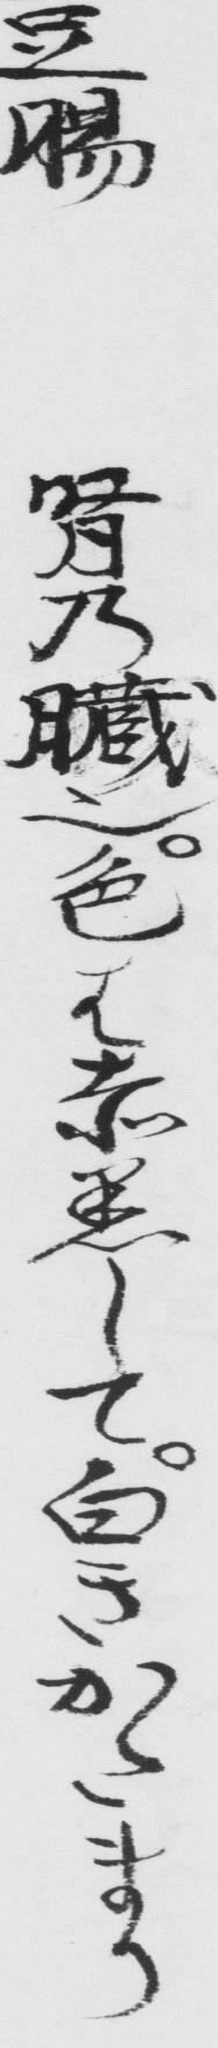豆腸腎の臓也。色は赤黒して。白きかたまり
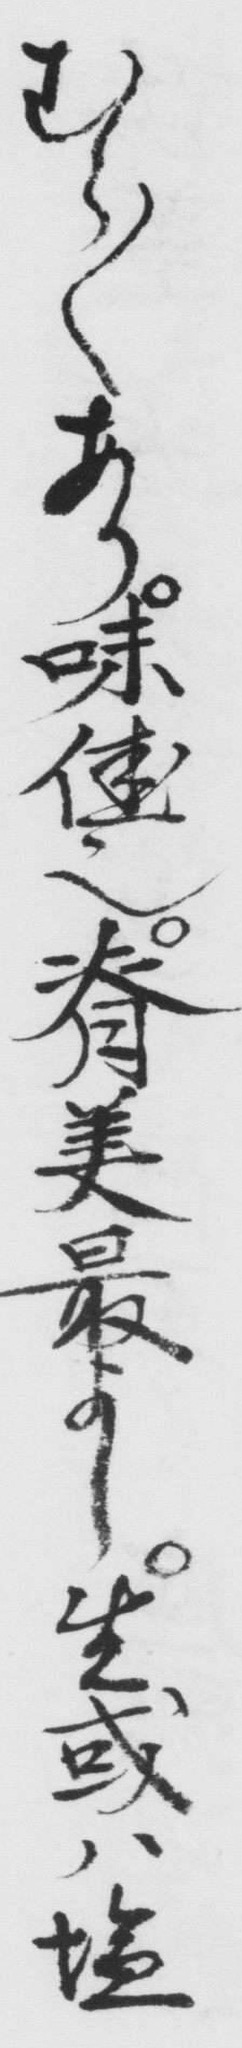むら〳〵あり。味佳也。背美最よし。生或は塩
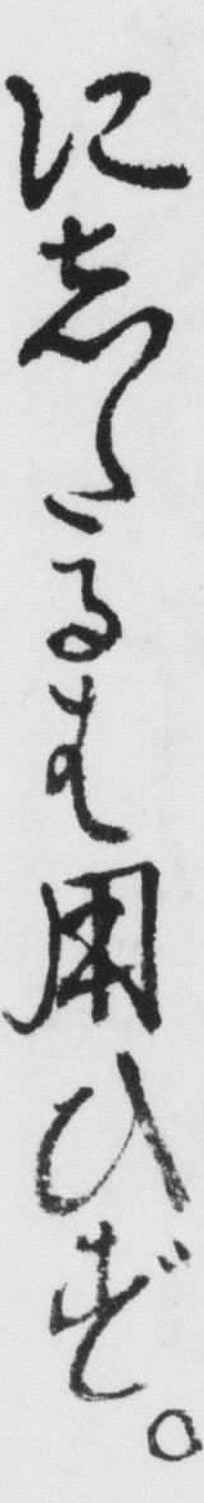にしたるは用ひず。
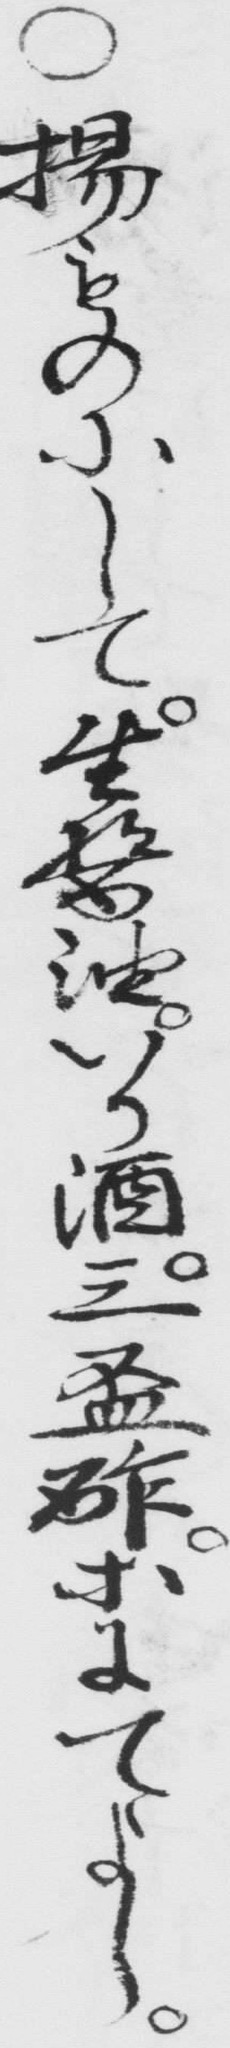○揚ものにして。生醤油。いり酒。三盃酢。等にてよし。
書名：鯨肉調味方
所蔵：大阪府立大学学術情報センター 国文学研究資料館
